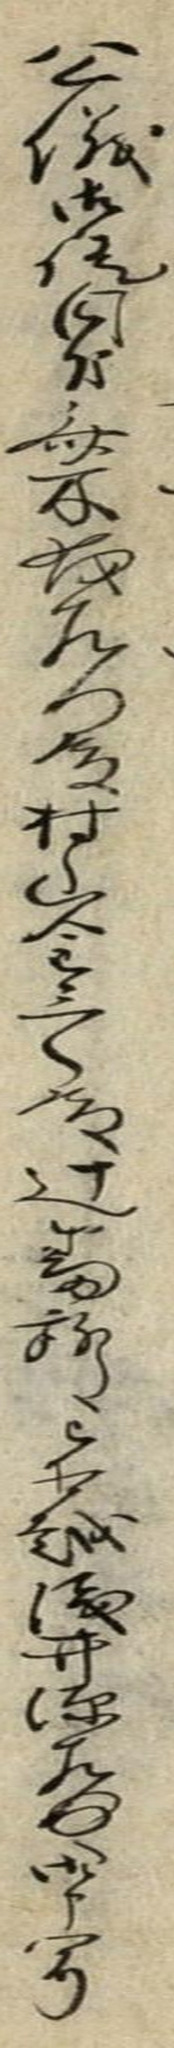公儀御徒目付斎木茂左衛門殿村山金三郎殿辻番所へ被相越浅井源左衛門へ御申聞
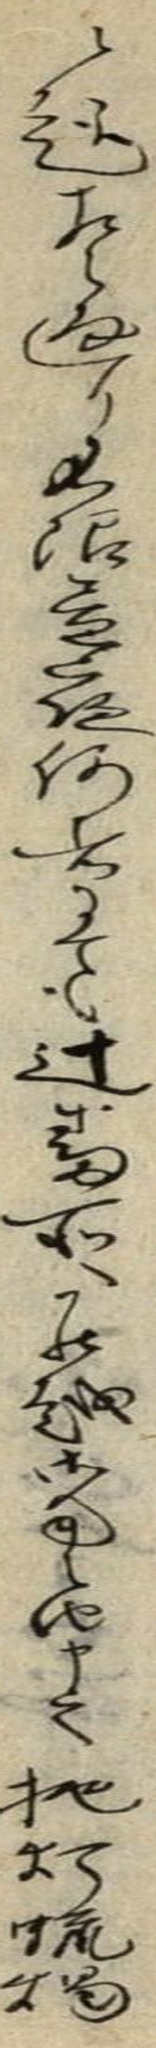候趣左之通り不限昼夜何者にても辻番所へ罷越御用之由申之挑灯蝋燭
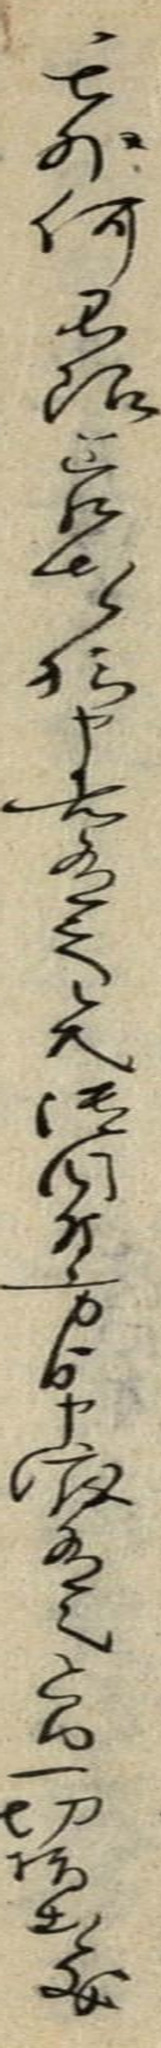其外何不限差出候様申者有之候共御目付方ゟ申渡有之候間一切指出候義
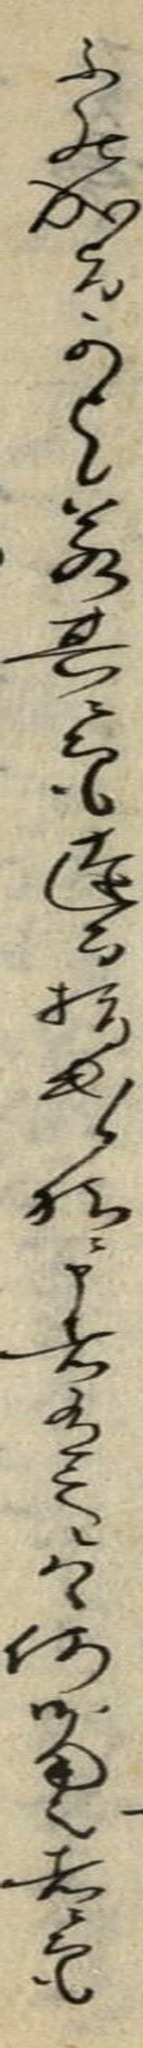不罷成旨可申候若其にても達て指出候様に申者有之候はゝ何御用之者にても
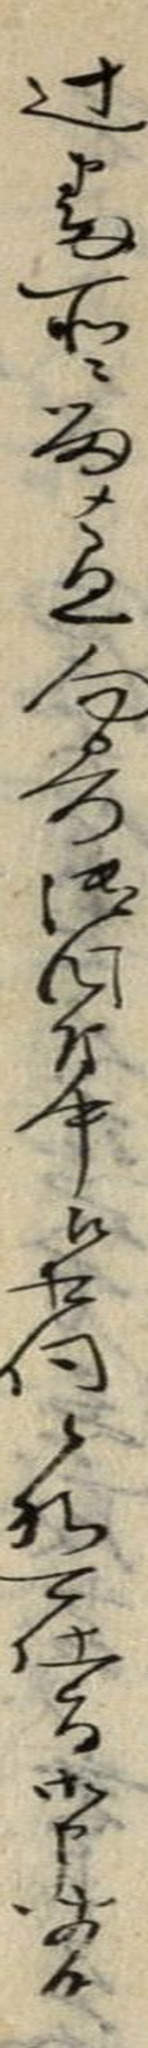辻番所に留め置向寄御目付中江相伺候様可仕旨御申聞候
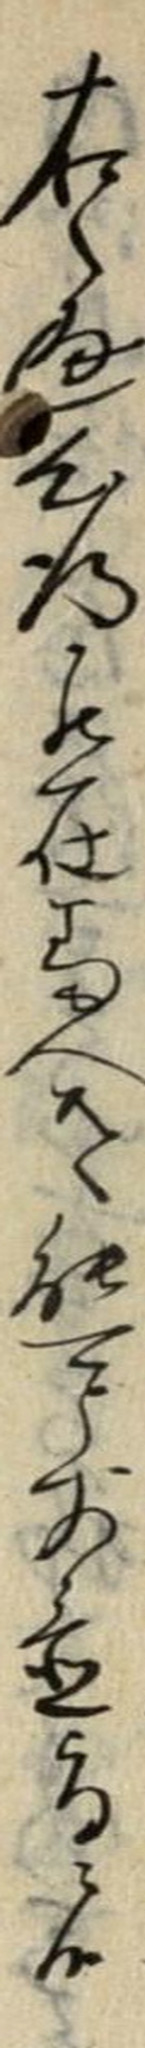右之通心得罷在番人共へ能可申聞置旨に候
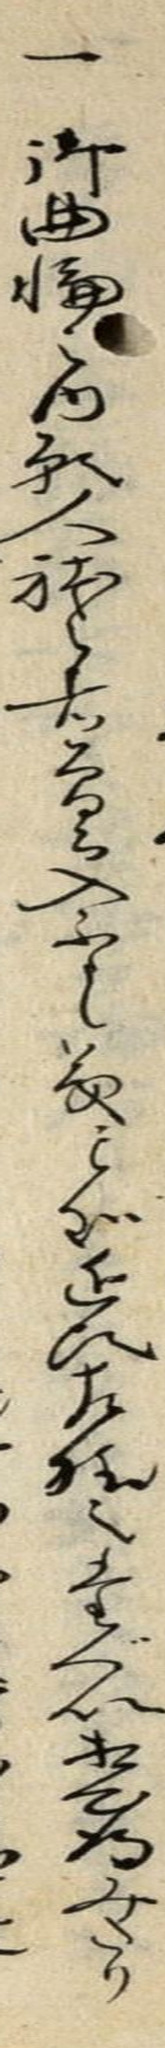一御曲輪之内願人体之者曽て入不申義に候処近頃左様之たぐい相心得みたり
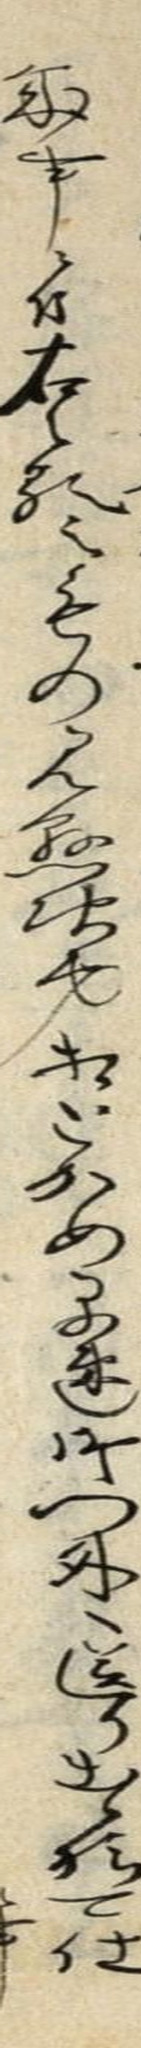成事に付右之類之もの見懸次第相とかめ早速御門外へ送り出候様可仕事
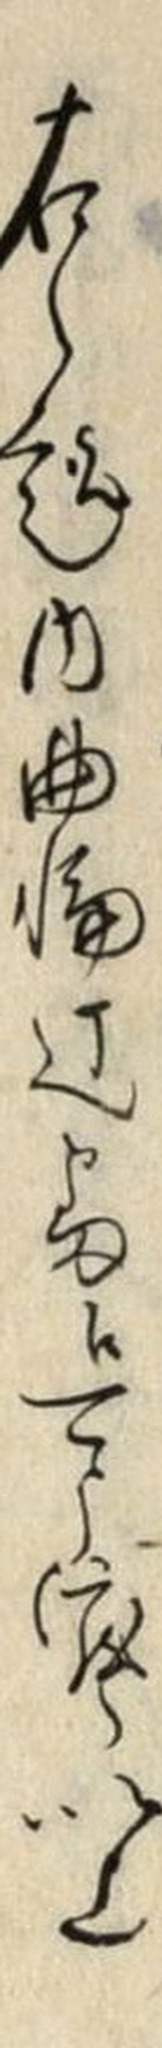右之趣内曲輪辻番江可申渡候以上
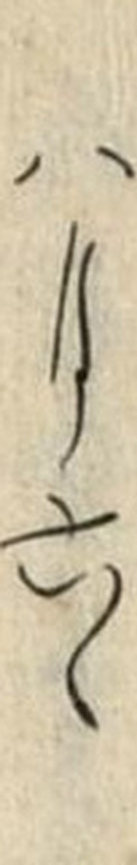八月六日
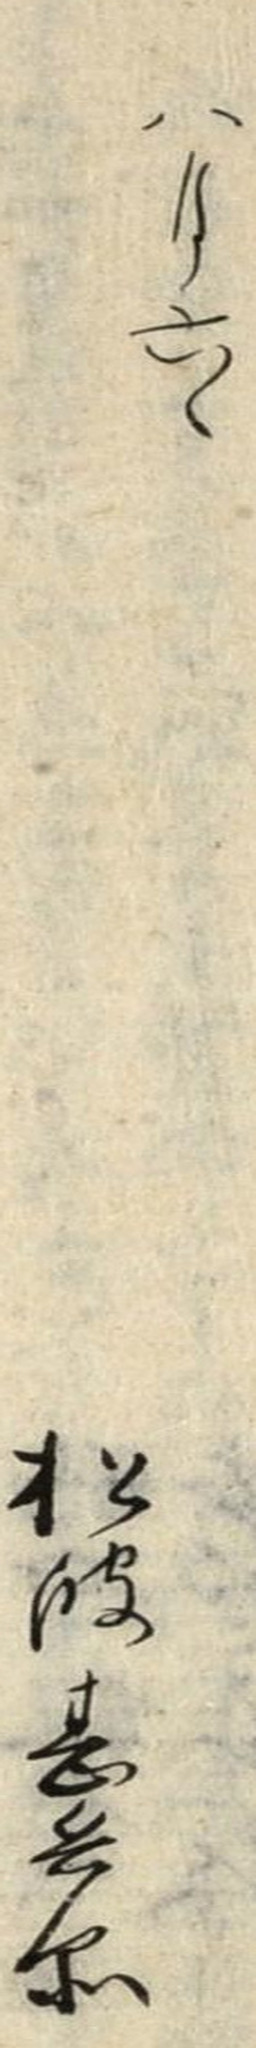松波甚兵衛
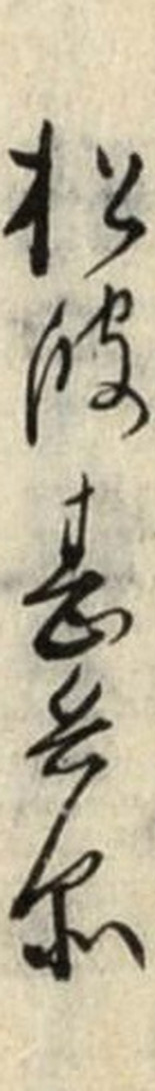松波甚兵衛
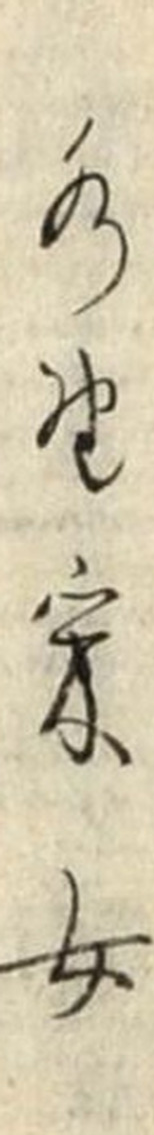水野采女
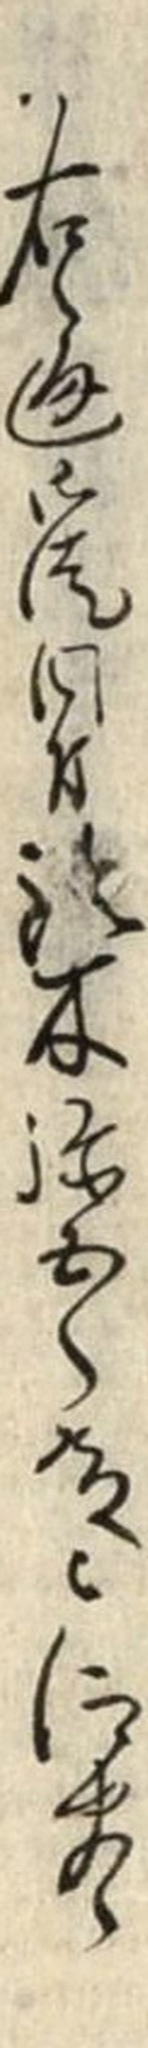右之通御徒目付鈴木弥五郎殿被仰聞候
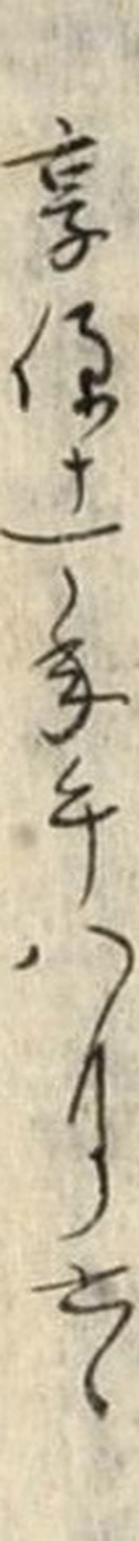享保十一年午八月六日
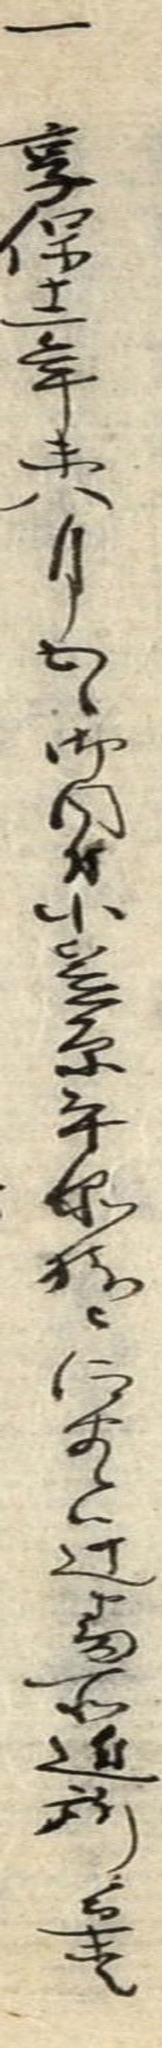一享保十二年未八月五日御目付小笠原平兵衛様に被仰聞候は辻番所近所にて末々
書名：三都并道中之部
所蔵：福井県文書館 Fukui Prefectural Archives
